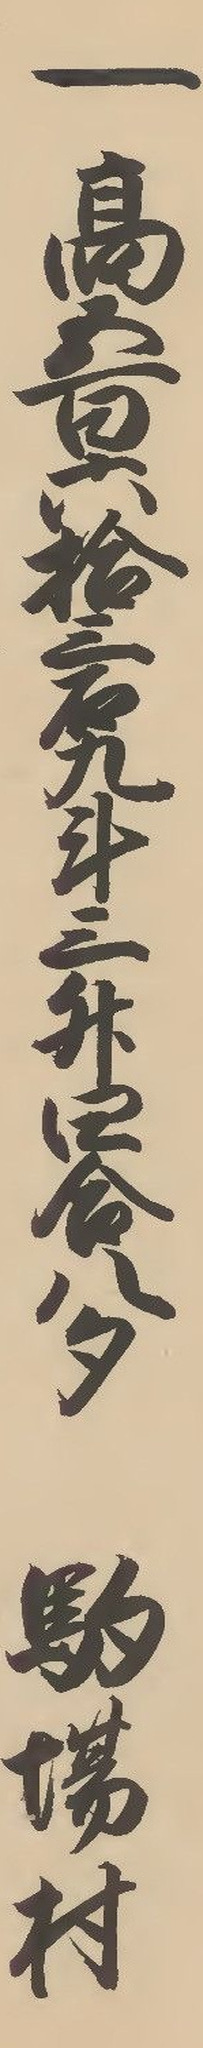一高五百六拾三石九斗三升四合八勺駒場村
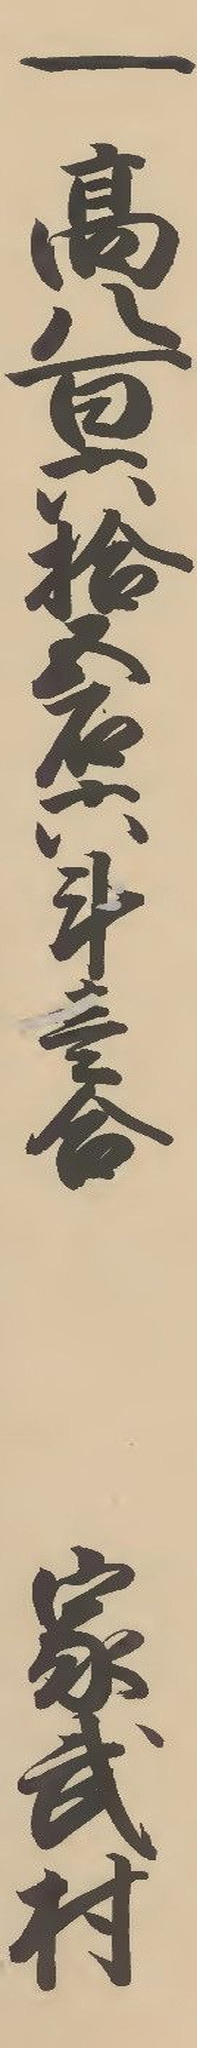一高八百六拾五石六斗壱合家武村
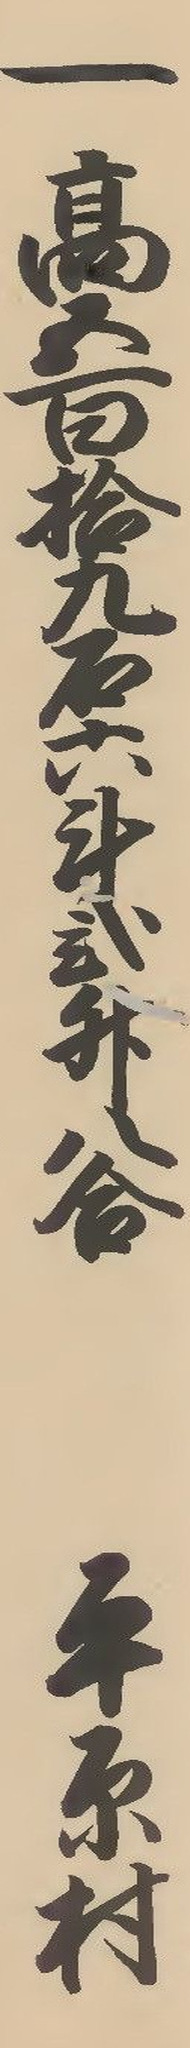一高五百拾九石六斗弐升八合平原村
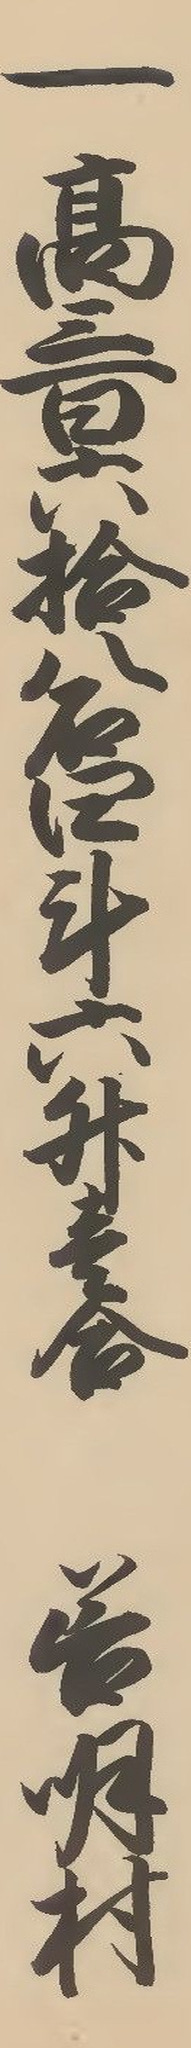一高三百六拾八石四斗六升壱合善明村
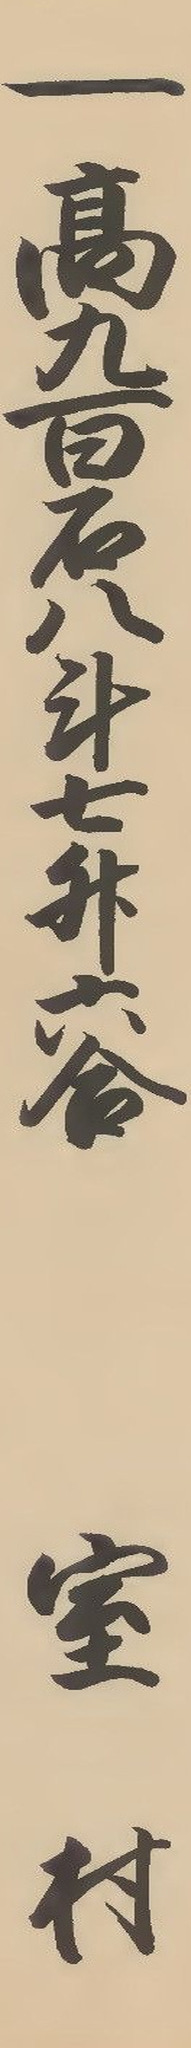一高九百石八斗七升六合室村
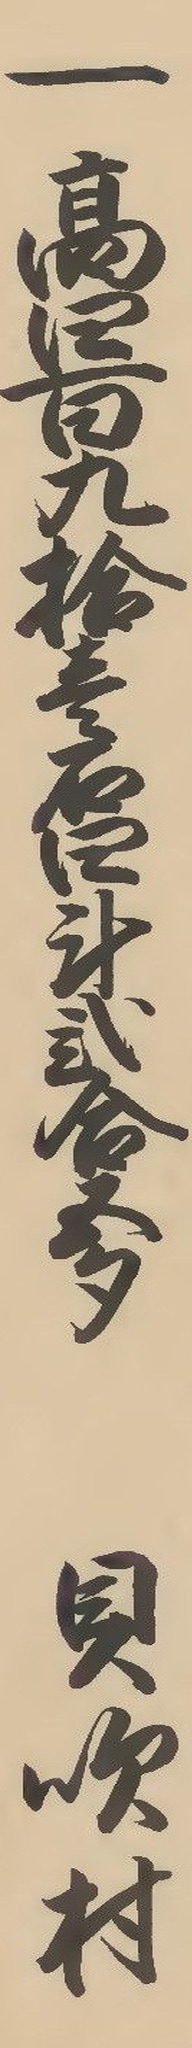一高四百九拾壱石四斗弐合五勺貝吹村

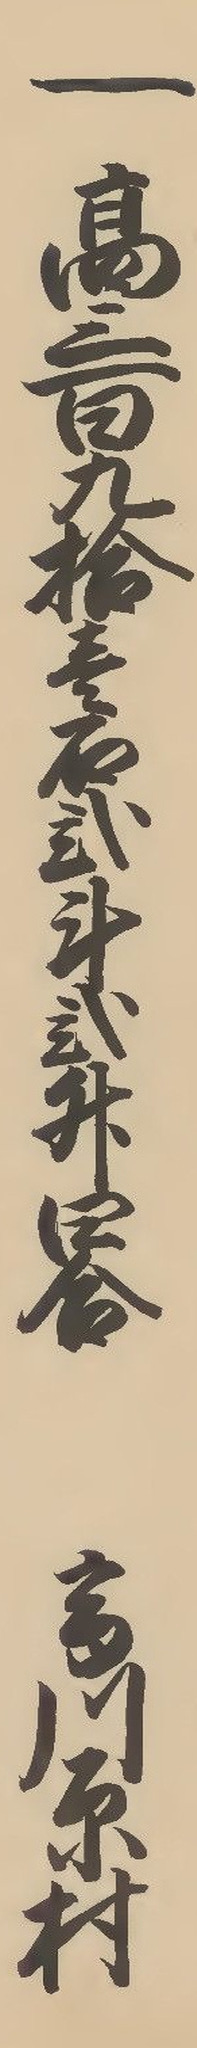一高三百九拾壱石弐斗弐升四合高川原村
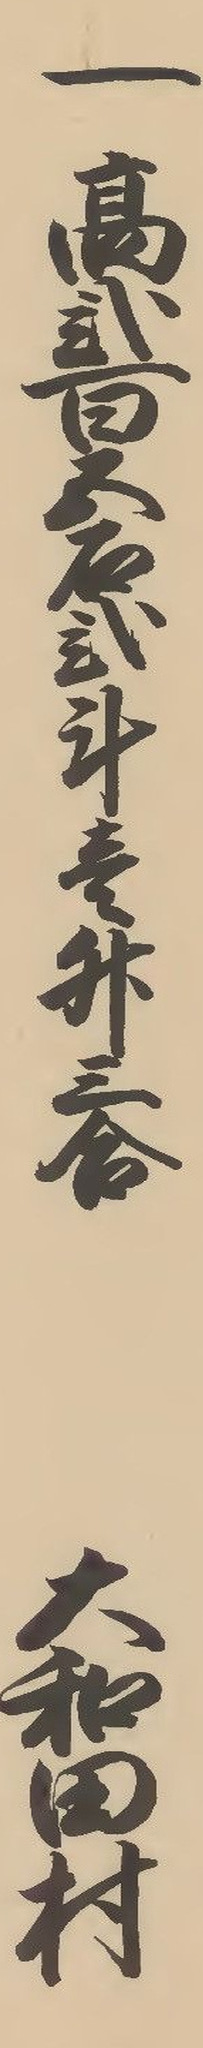一高弐百五石弐斗壱升三合大和田村
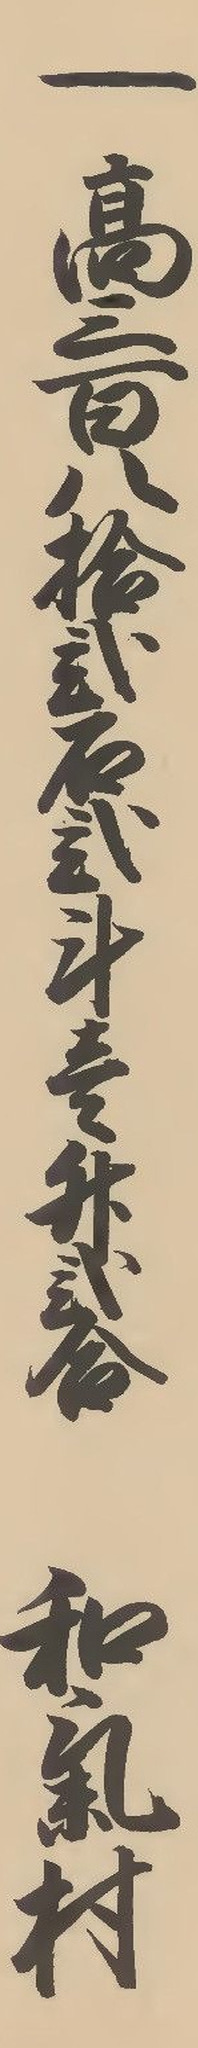一高三百八拾弐石弐斗壱升弐合和気村
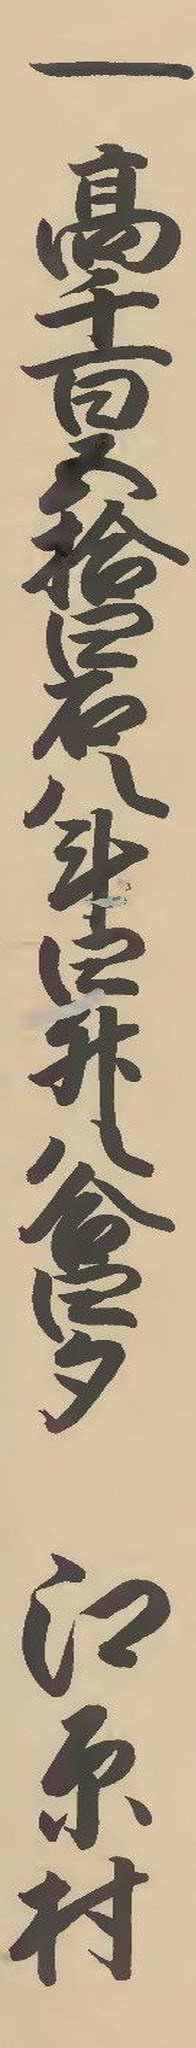一高千百五拾四石八斗四升八合四勺江原村
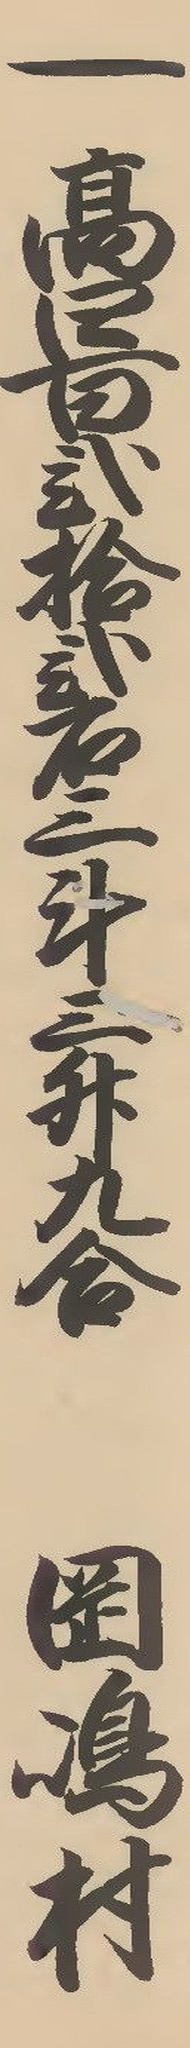一高四百弐拾弐石三斗三升九合岡島村
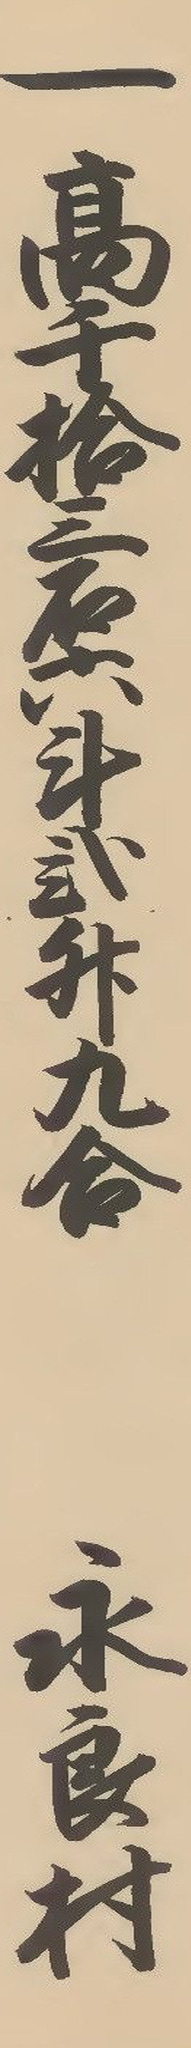一高千拾三石六斗弐升九合永良村
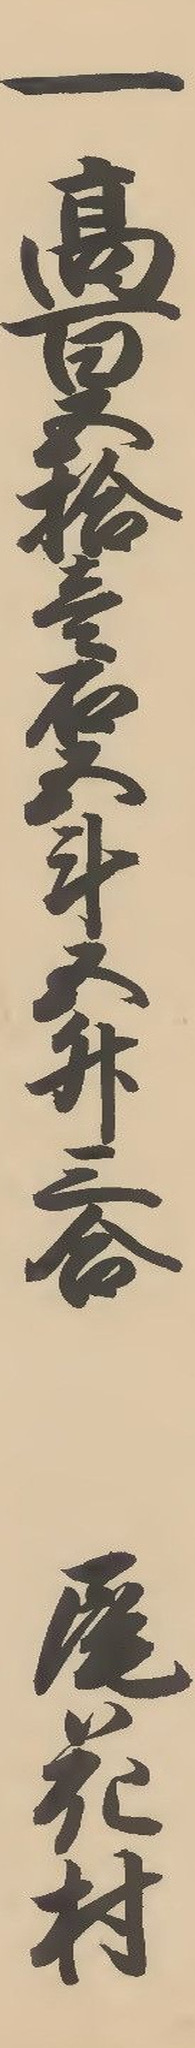一高百五拾壱石五斗五升三合尾花村
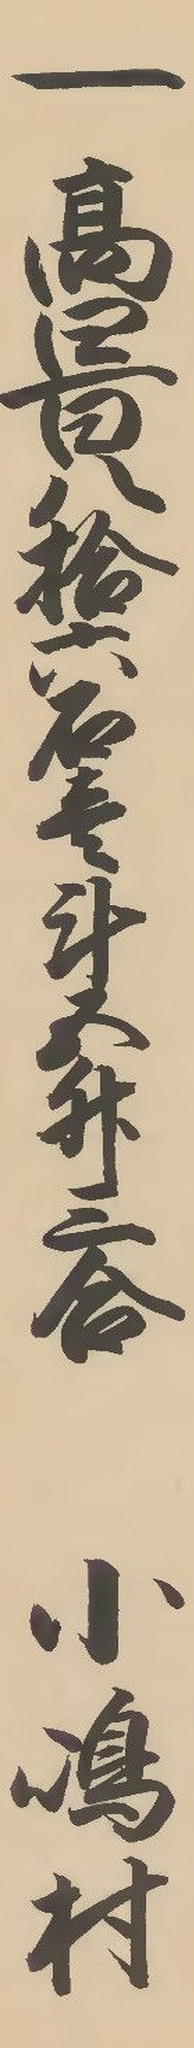一高四百八拾六石壱斗五升三合小島村

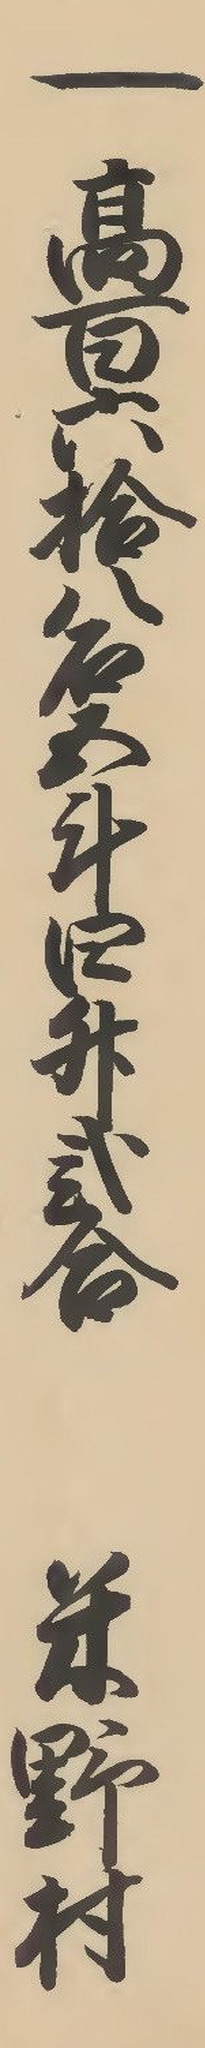一高百六拾八石五斗四升弐合米野村
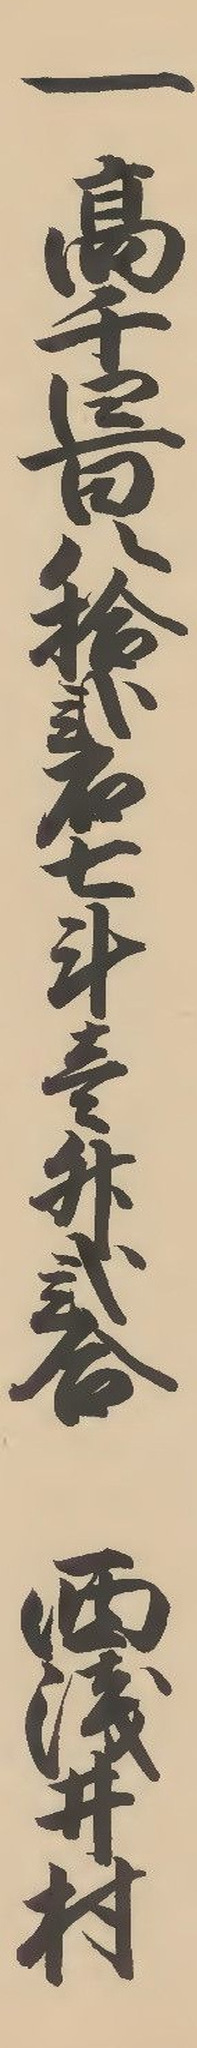一高千四百八拾弐石七斗壱升弐合西浅井村
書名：三河国郷帳
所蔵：国立公文書館 National Archives of Japan
